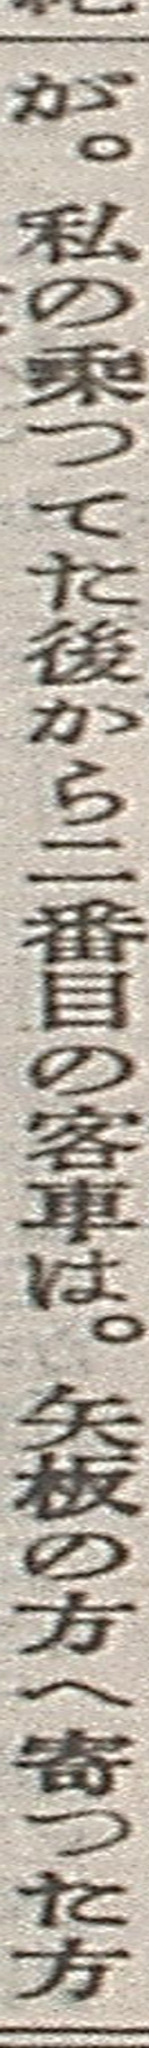が。私の乗つてた後から二番目の客車は。矢板の方へ寄つた方
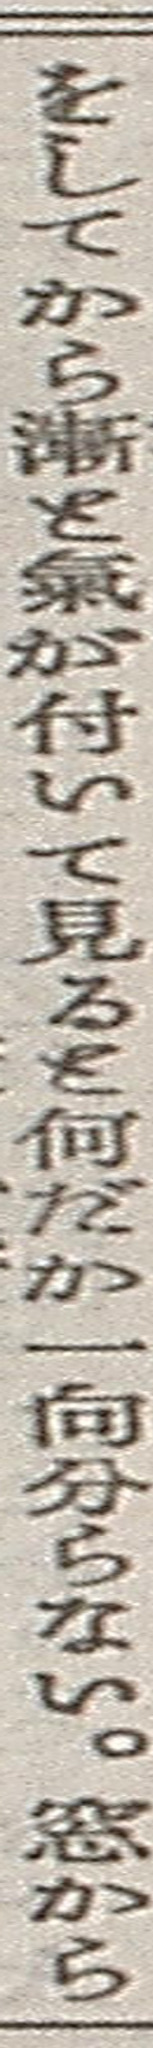をしてから漸と気が付いて見ると何だか一向分らない。窓から
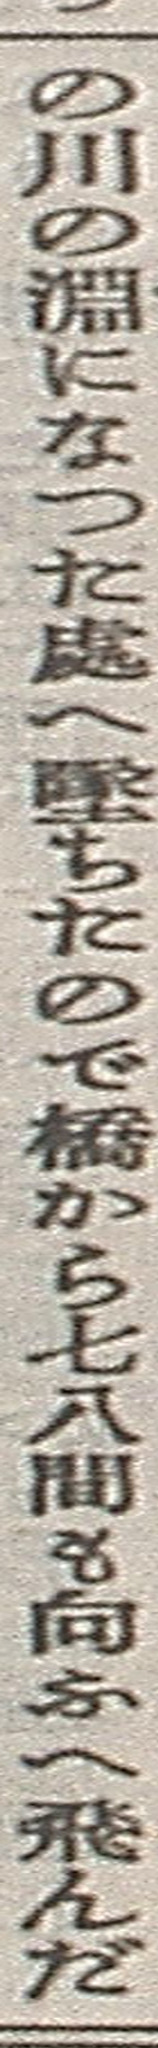の川の淵になつた処へ墜ちたので橋から七八間も向ふへ飛んだ
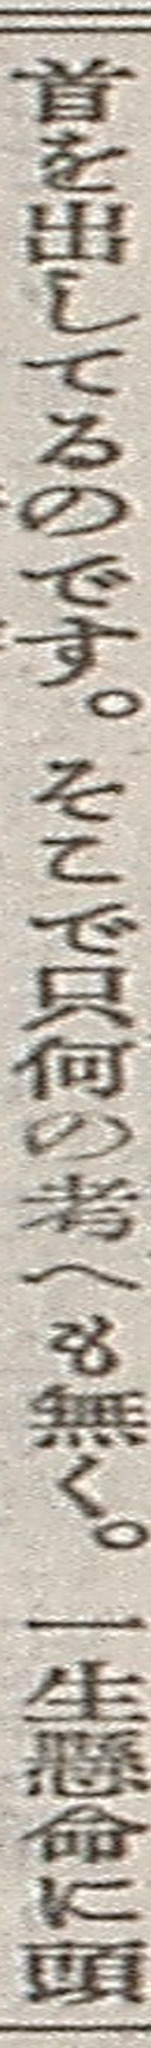首を出してるのです。そこで只何の考へも無く。一生懸命に頭
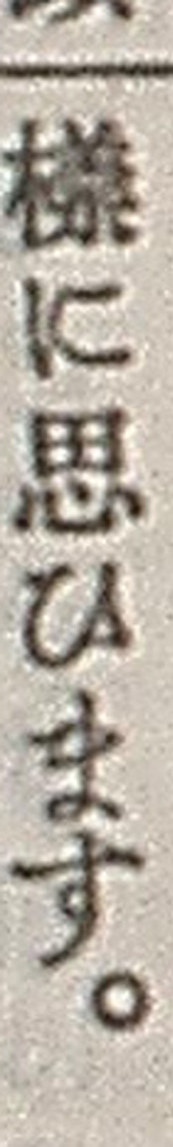様に思ひます。
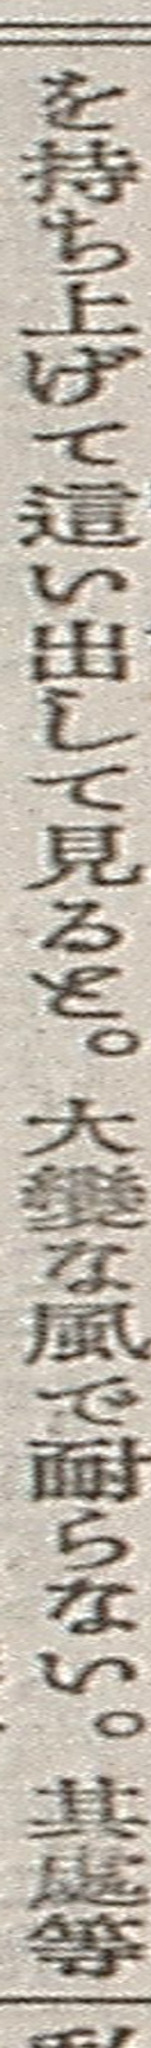を持ち上げて這い出して見ると。大変な風で耐らない。其処等
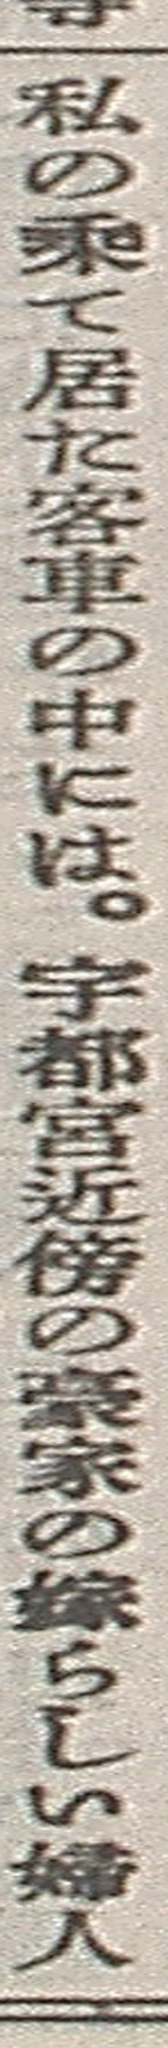私の乗て居た客車の中には。宇都宮近傍の豪家の嫁らしい婦人
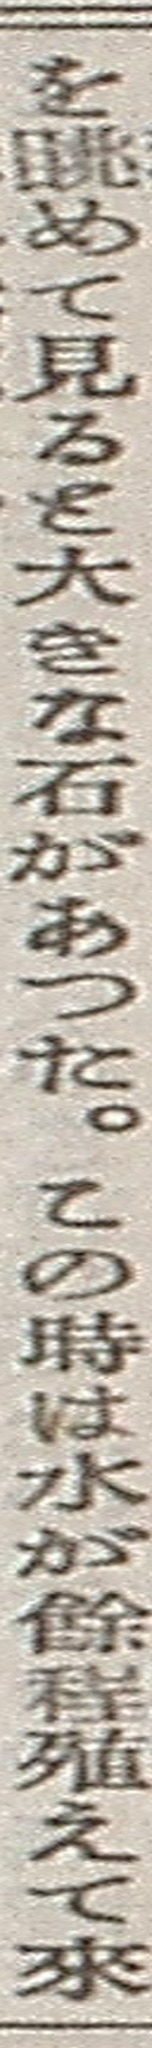を眺めて見ると大きな石があつた。この時は水が余程殖えて来
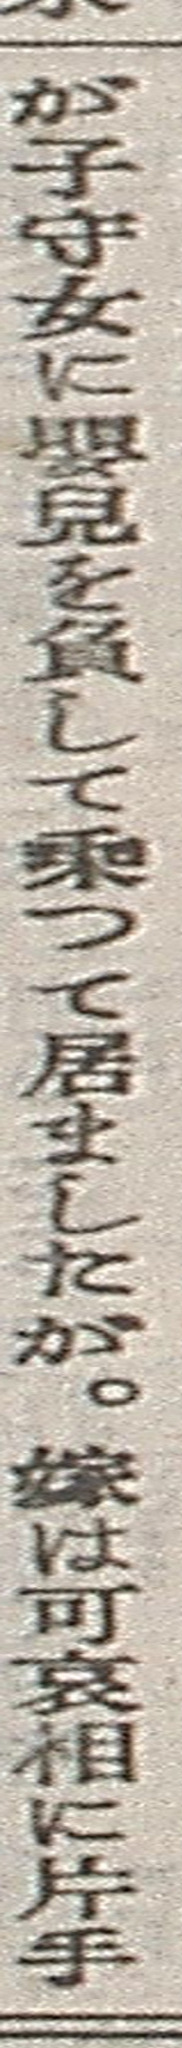が子守女に嬰児を負して乗つて居ましたが。嫁は可哀想に片手
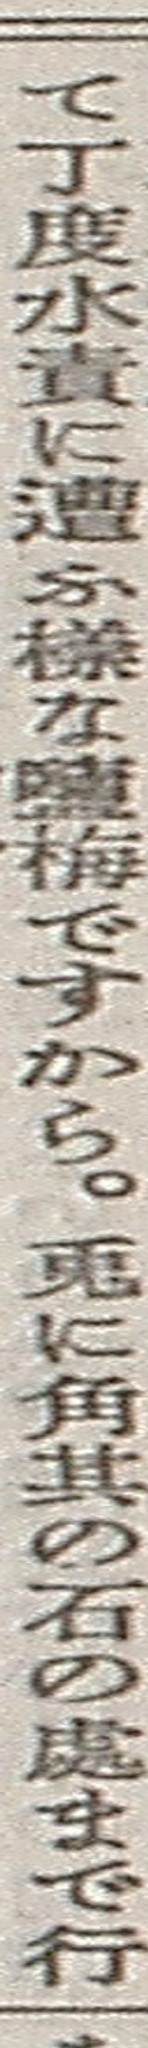て丁度水責に遭ふ様な塩梅ですから。兎に角其の石の処まで行
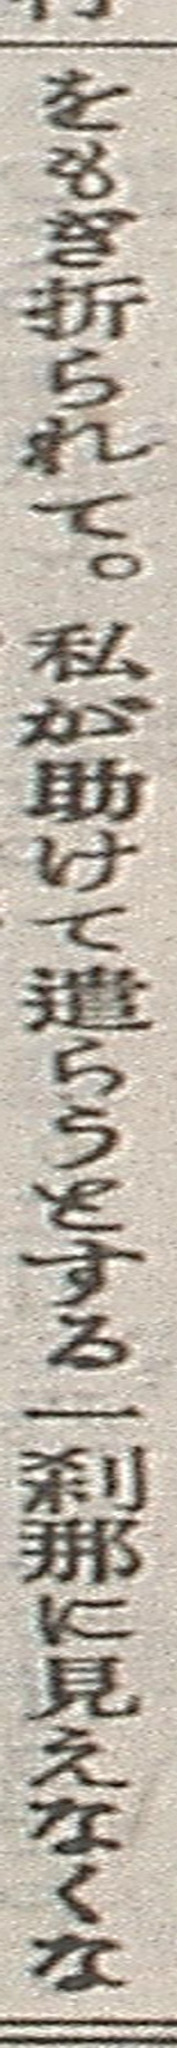をもぎ折られて。私が助けて遣らうとする一刹那に見えなくな
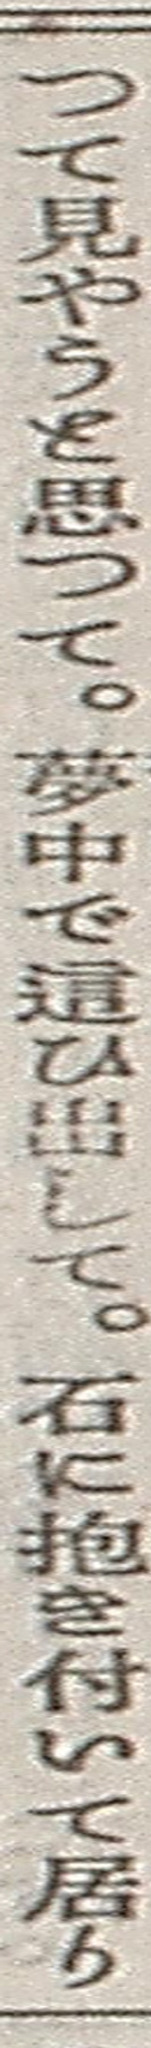つて見やうと思つて。夢中で這ひ出して。石に抱き付いて居り
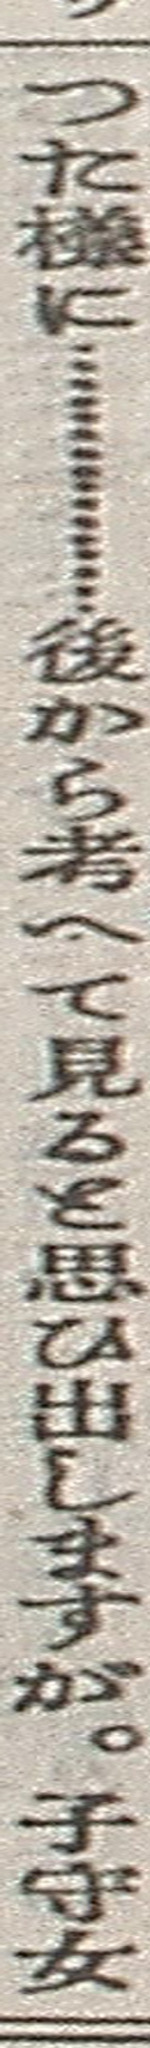つた様に………………後から考へて見ると思ひ出しますが。子守女
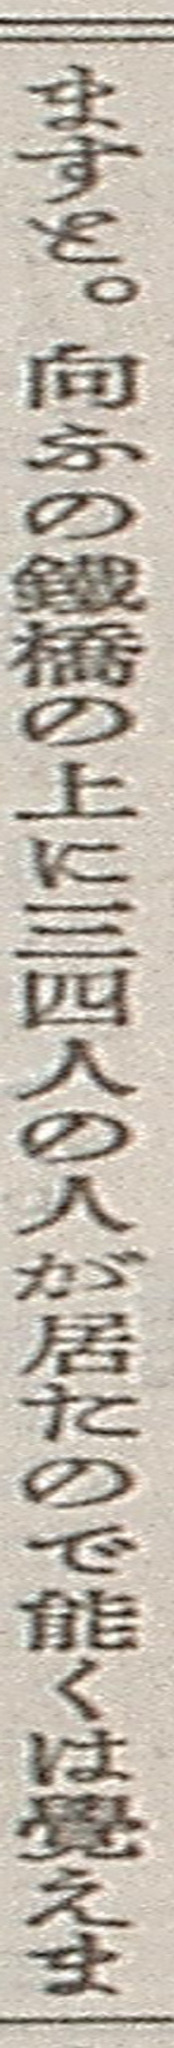ますと。向ふの鉄橋の上に三四人の人が居たので能くは覚えま
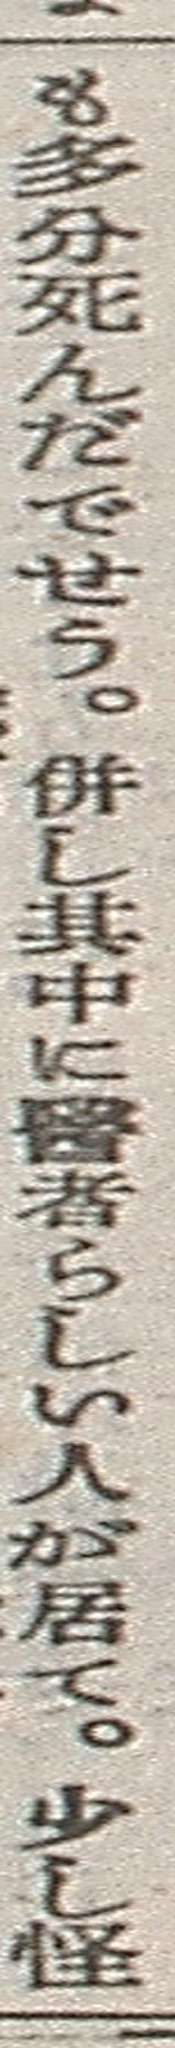も多分死んだでせう。併し其中に医者らしい人が居て。少し怪
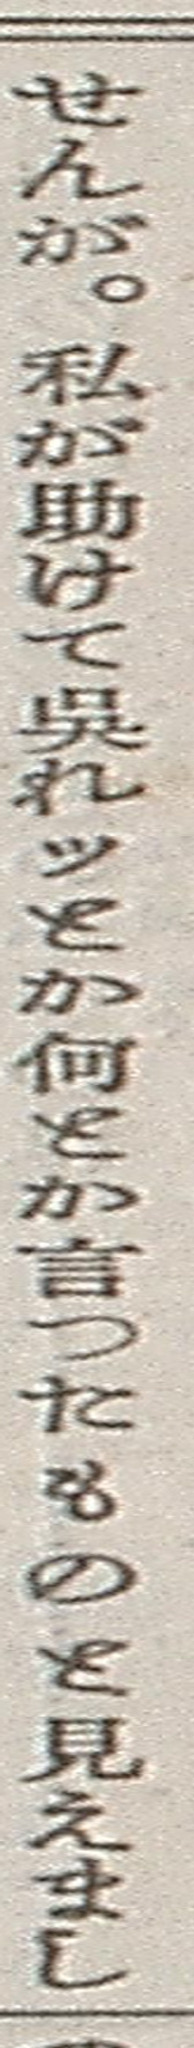せんが。私が助けて呉れツとか何とか言つたものと見えまし
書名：風俗畫報臨時増刊第百九十九號　明治三十二年十月各地災害圖會（前編之續）
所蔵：東京大学地震研究所図書室 Earthquake Research Institute Library, The University of Tokyo, JAPAN
